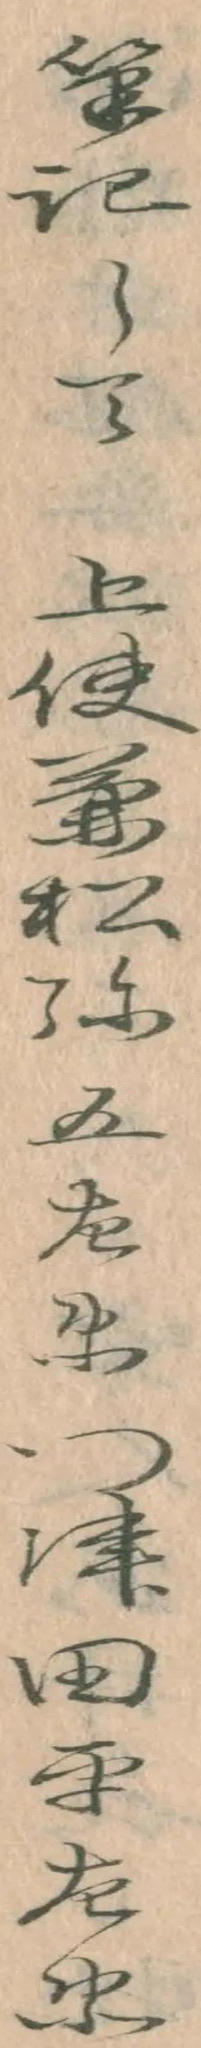筆記して上使兼松弥五左衛門津田平左衛
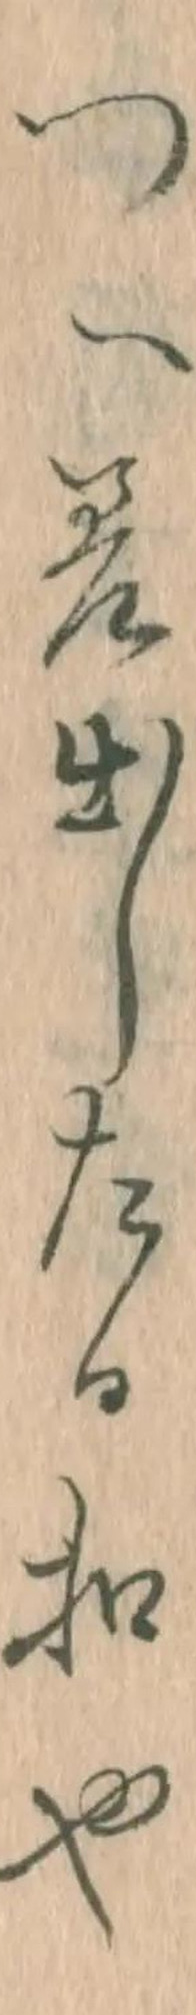門へ差出したる扣也
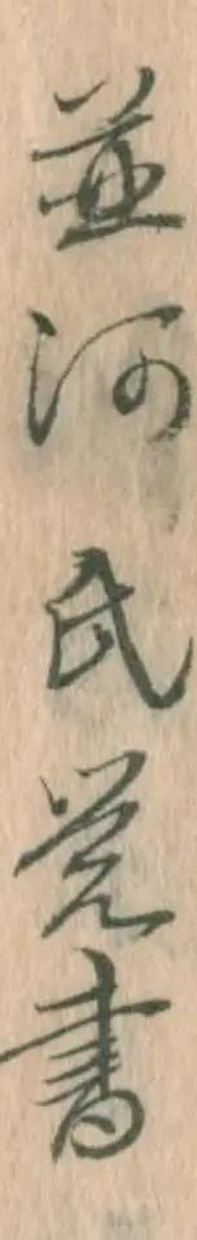並河氏覚書
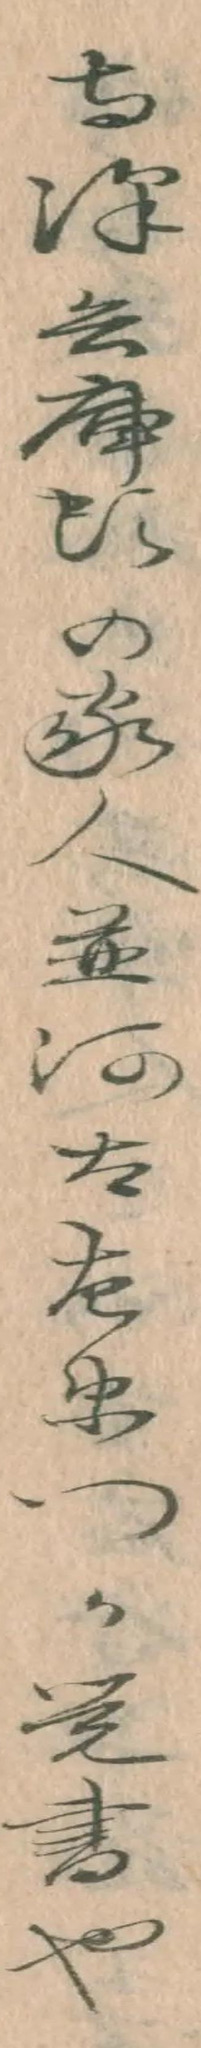寺沢兵庫頭の家人並河太左衛門か覚書也
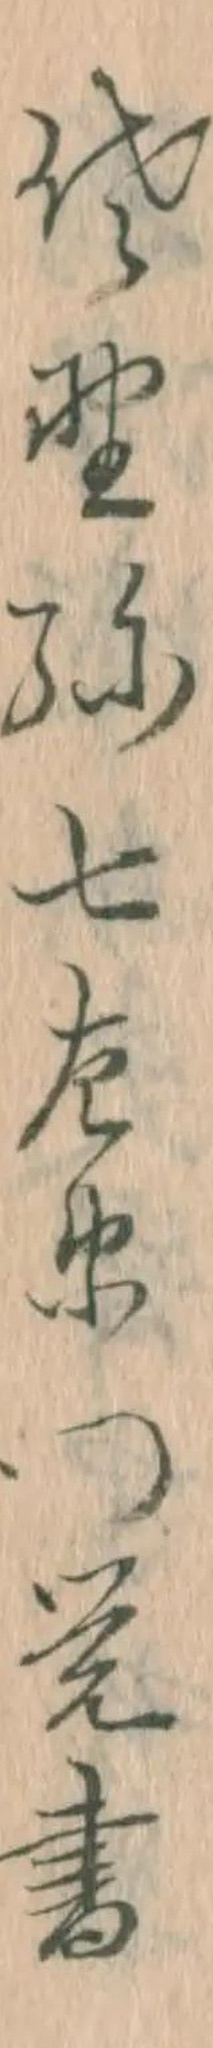佐野弥七左衛門覚書
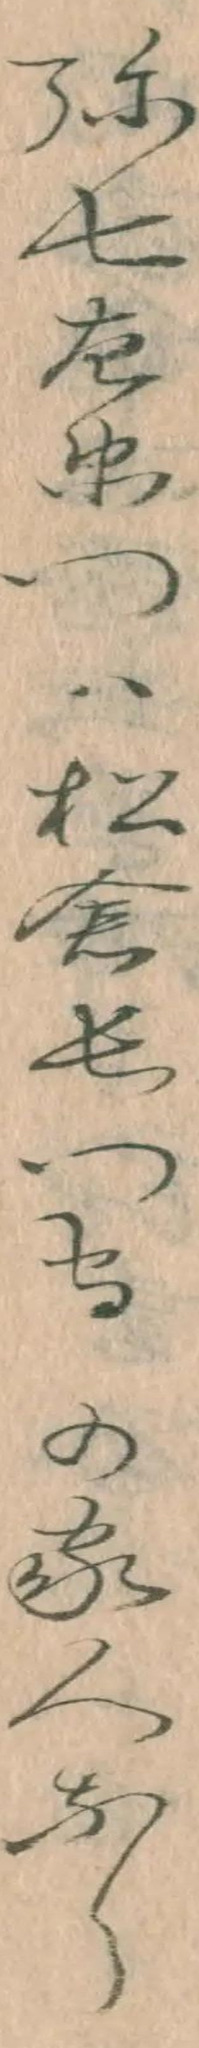弥七左衛門は松倉長門守の家人なり
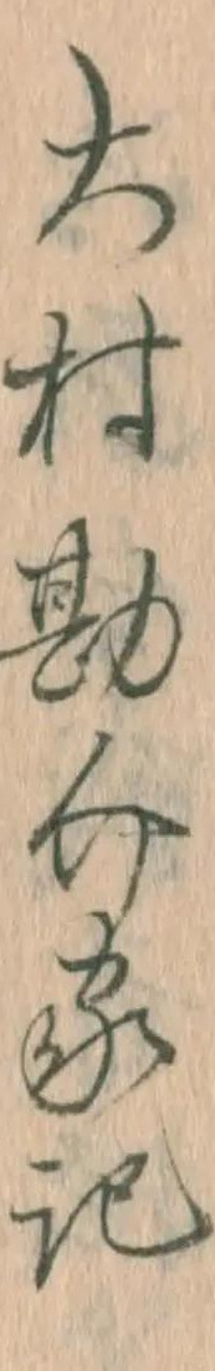大村勘介家記
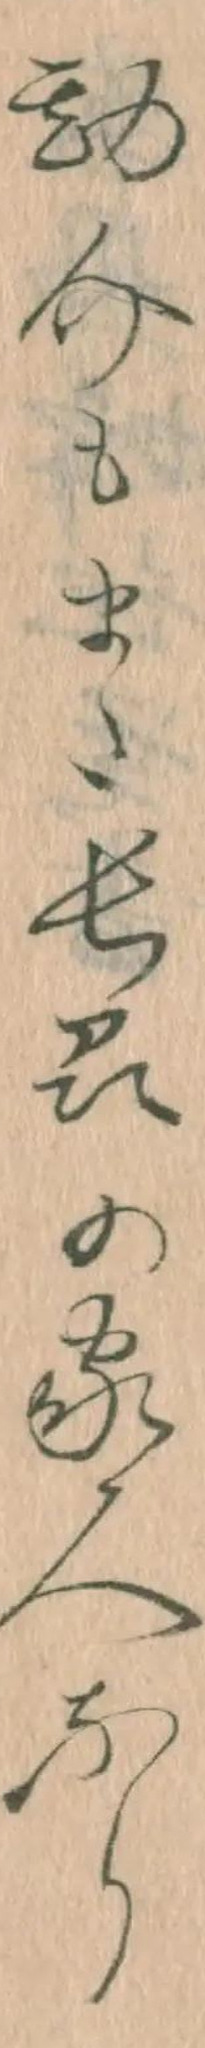勘介もまた長州の家人なり
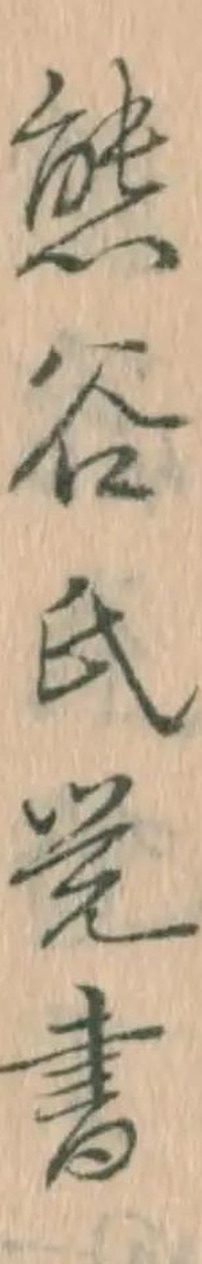熊谷氏覚書
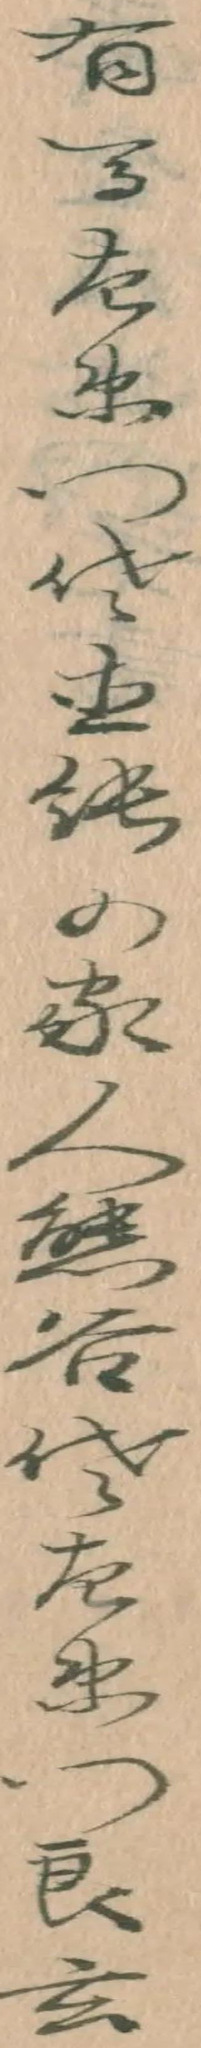有馬左衛門佐直純の家人熊谷佐左衛門良玄
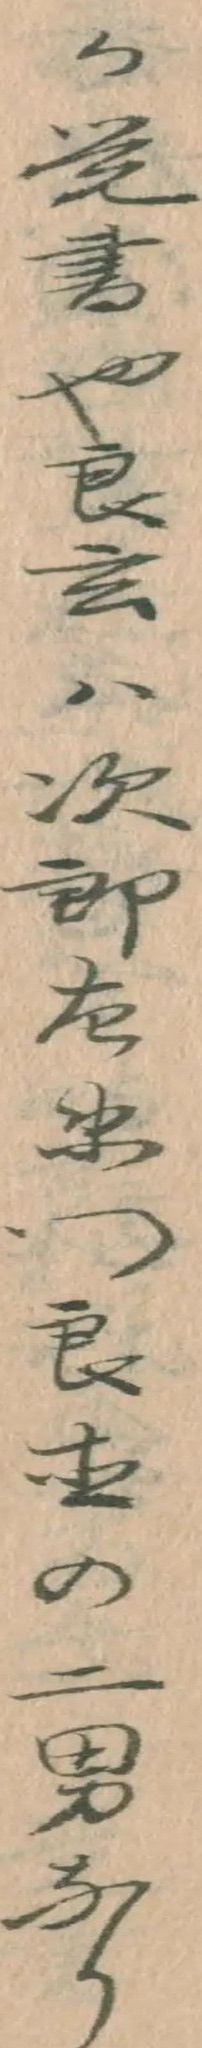か覚書也良玄は次郎左衛門良直の二男なり
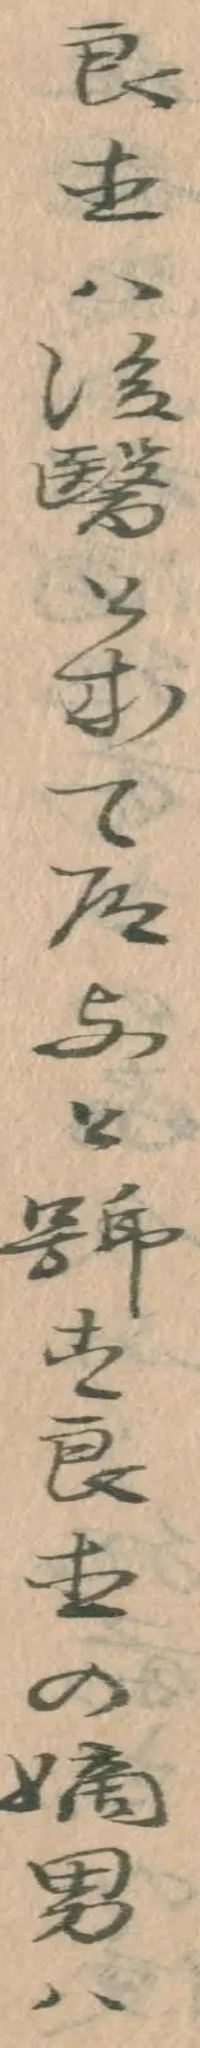良直は後医と成て道与と号す良直の嫡男は
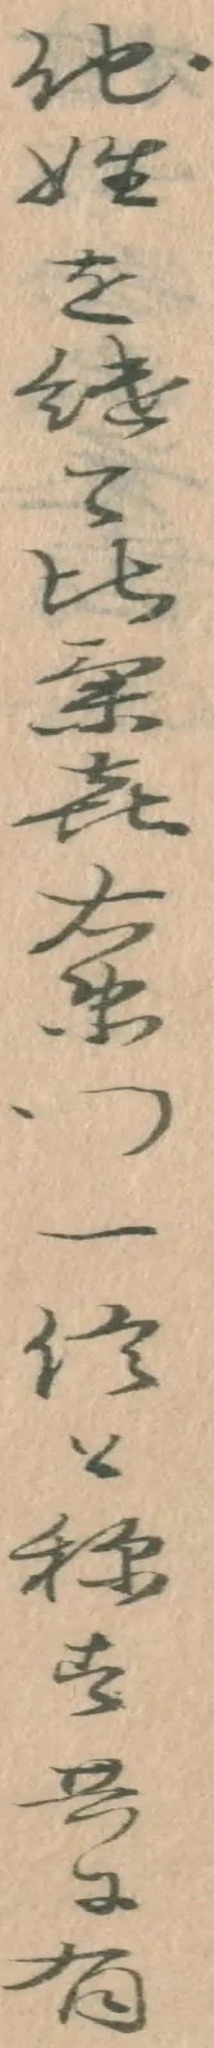他姓を継て比気喜右衛門一信と称す共に有
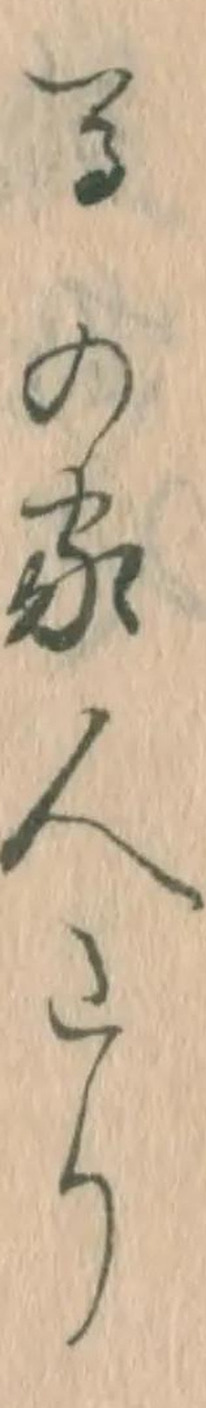馬の家人たり
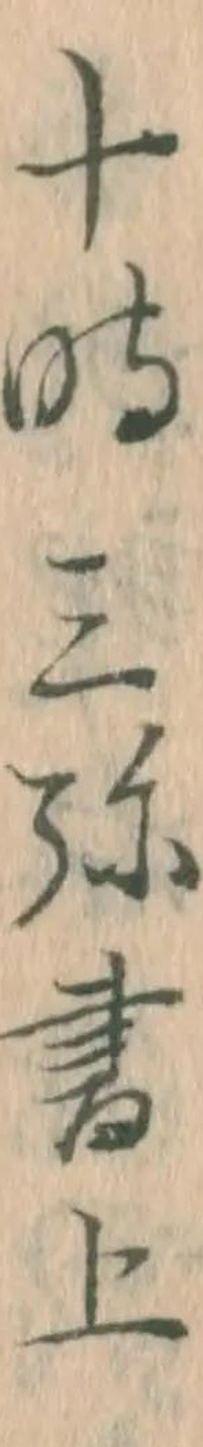十時三弥書上
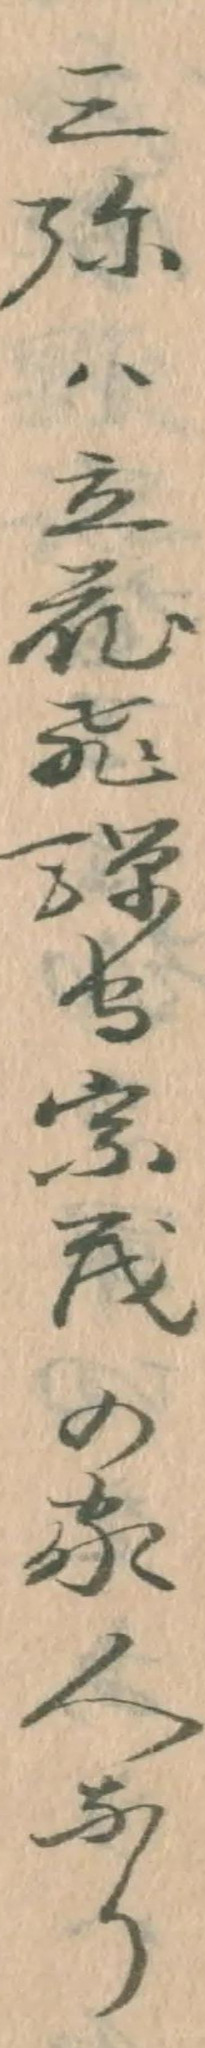三弥は立花飛騨守宗茂の家人なり
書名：切支丹御退治記 49巻. [1]
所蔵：国立国会図書館 National Diet Library, JAPAN
